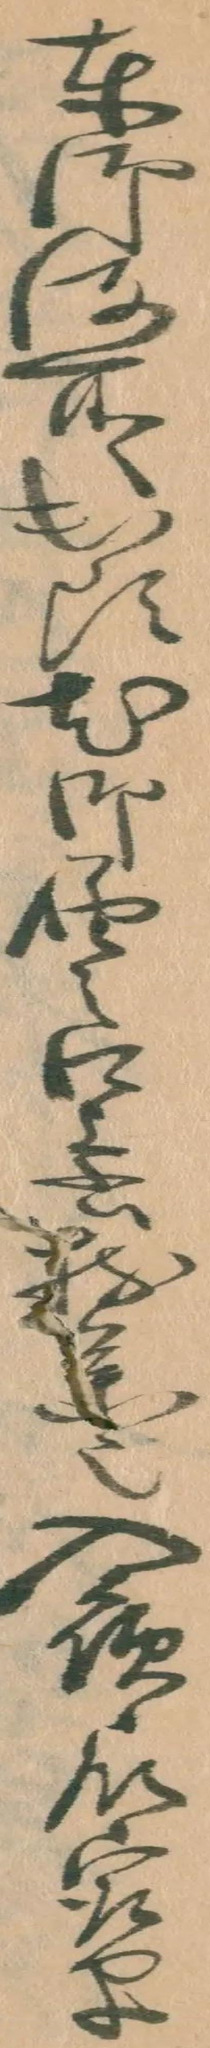東御役所へ出頭尤御届之口上書持参也入夜候故最早
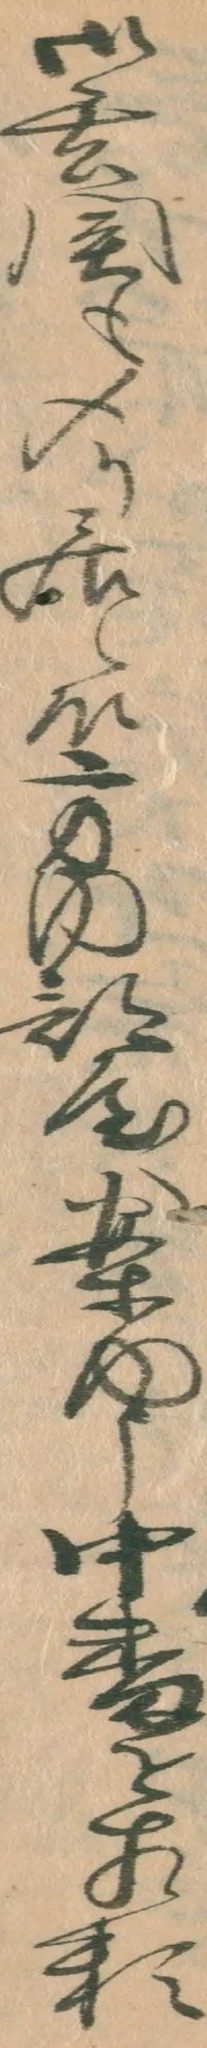御玄関も〆り居候故方内部屋へ案内申中番を相頼
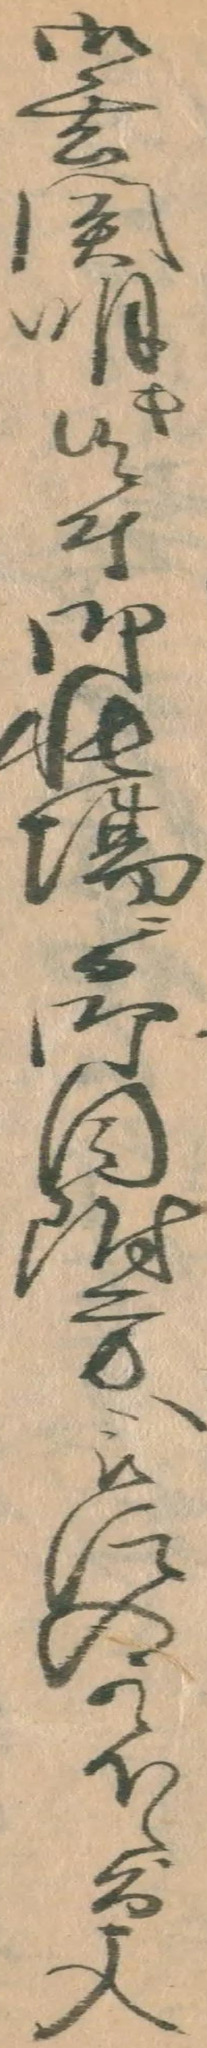御玄関明キ候ニ付御帳場ニ而御目付方へ被仰入可被下候旨申入
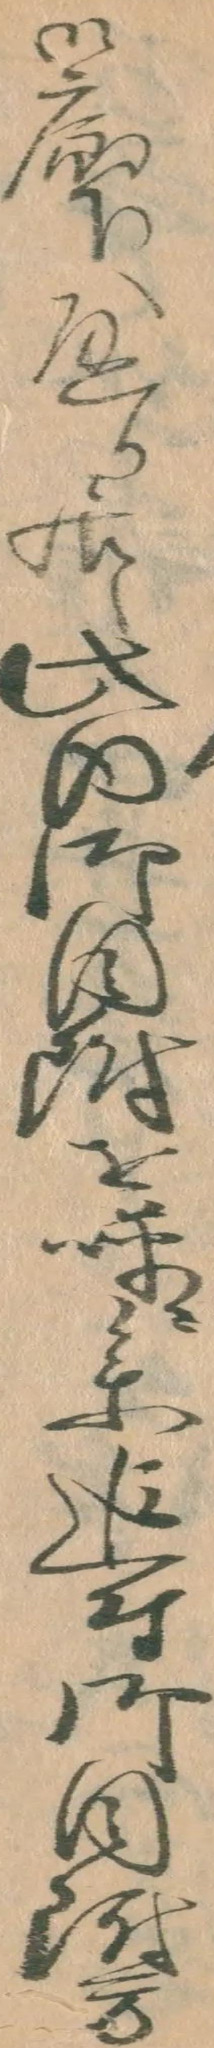御廊下へ通り居候此内御目付を呼ニ参追付御目付方
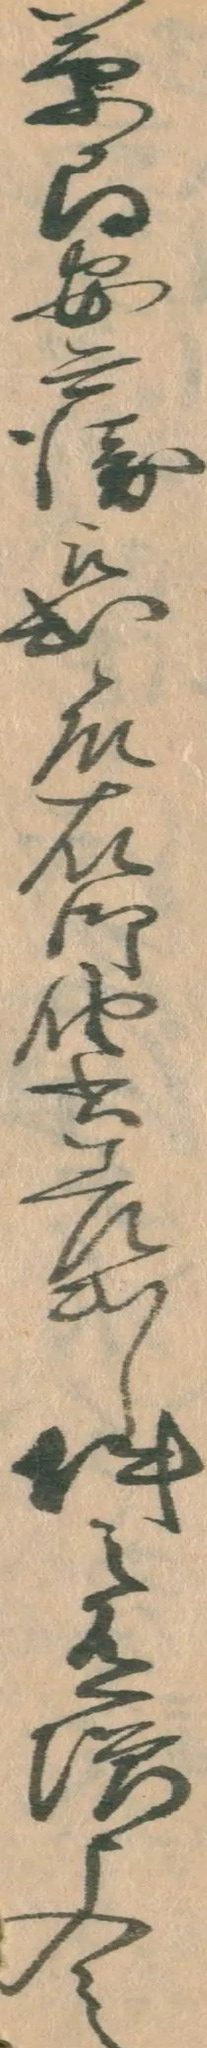草間安兵衛被出候故右御届書差出し件之有増申入之
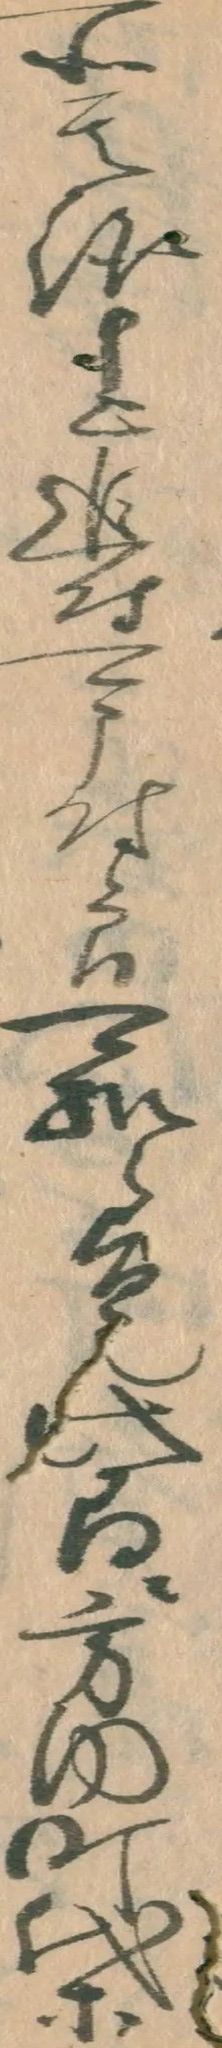所其趣申上追付可申付候間可扣候旨也此間ニ方内町代等
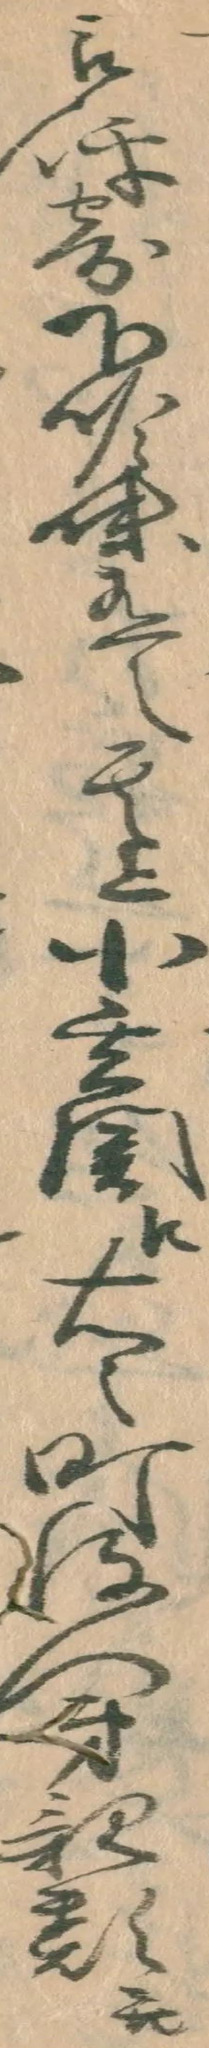被呼寄下吟味有之其上小玄関江右之町役人弟親類并
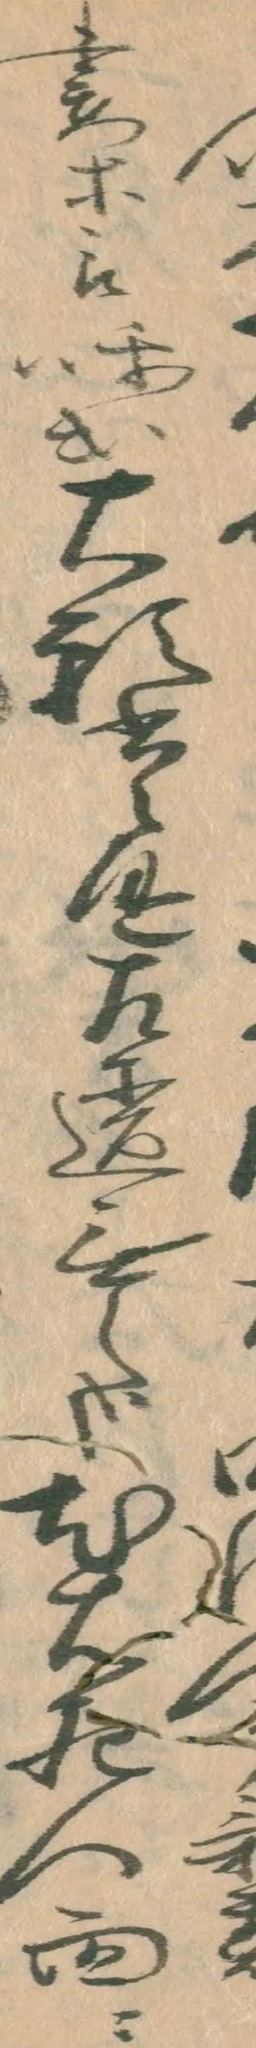妻等被呼出右願書之通相違無之哉尤右死人面ニ
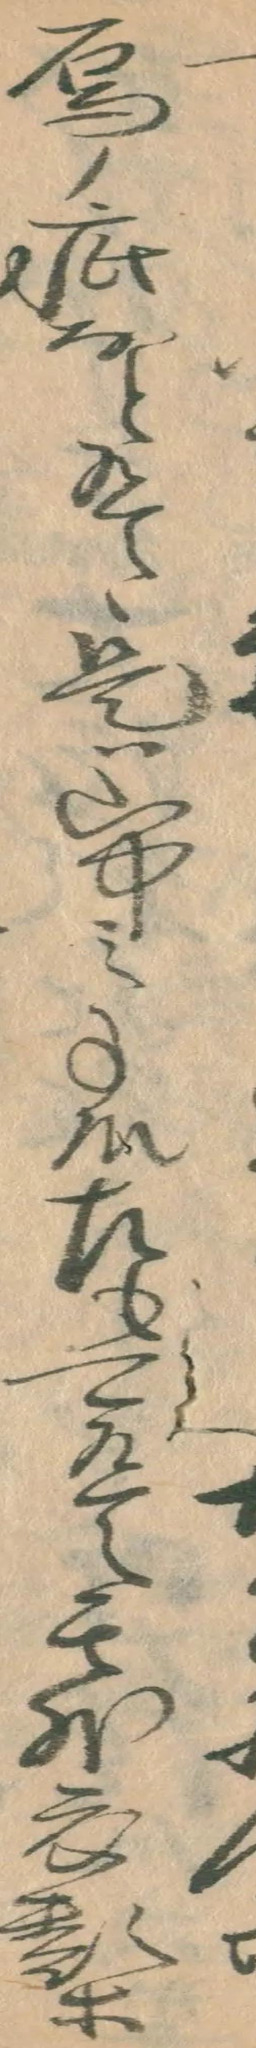烏ノ疵なと有之候是ハ山中之事故左も可有之其外衣類等
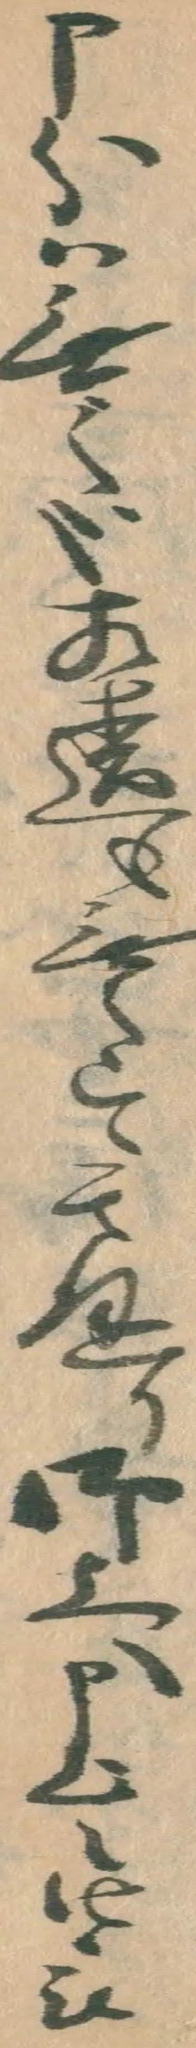申分ハ無之哉相違も無之候ハヽ其通り御上へ申上候由被
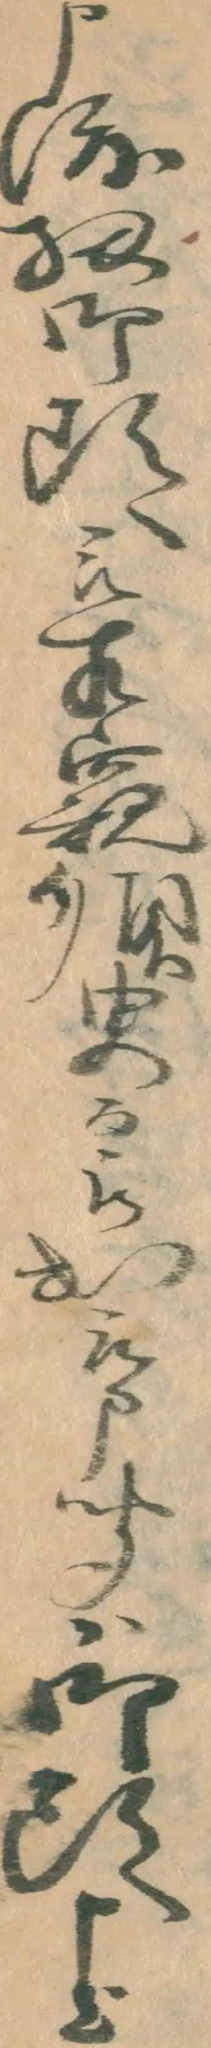申渡扨御頭へ被相窺被出被申聞ハ御頭へ申上

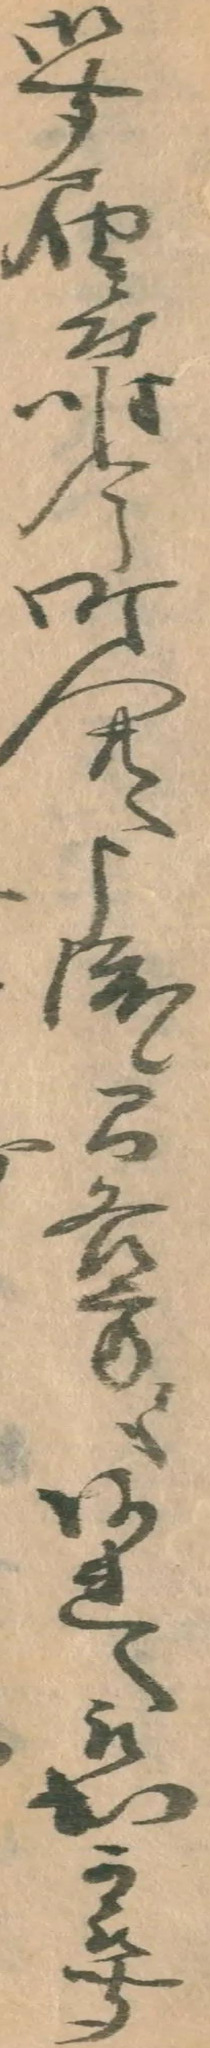御聞届ニ付唯今町人共へ申渡候間各方ニもあれへ被出可被聞
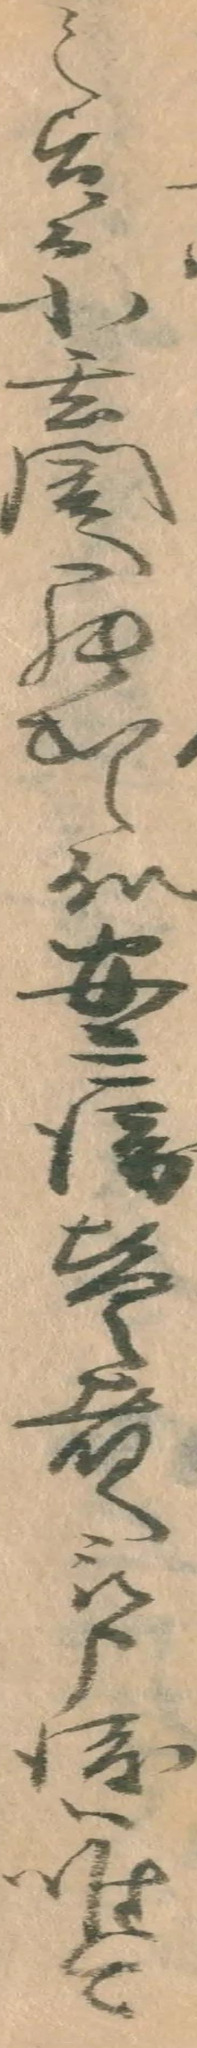之旨ニ而小玄関へ罷出候処安兵衛皆之者へ被申渡ハ唯今
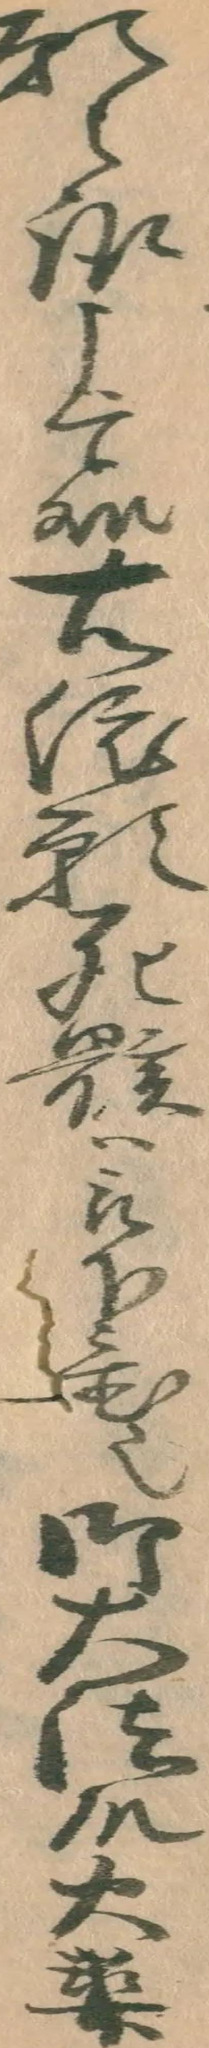願之趣申上候処右依願死骸ハ被下置也御大法故火葬
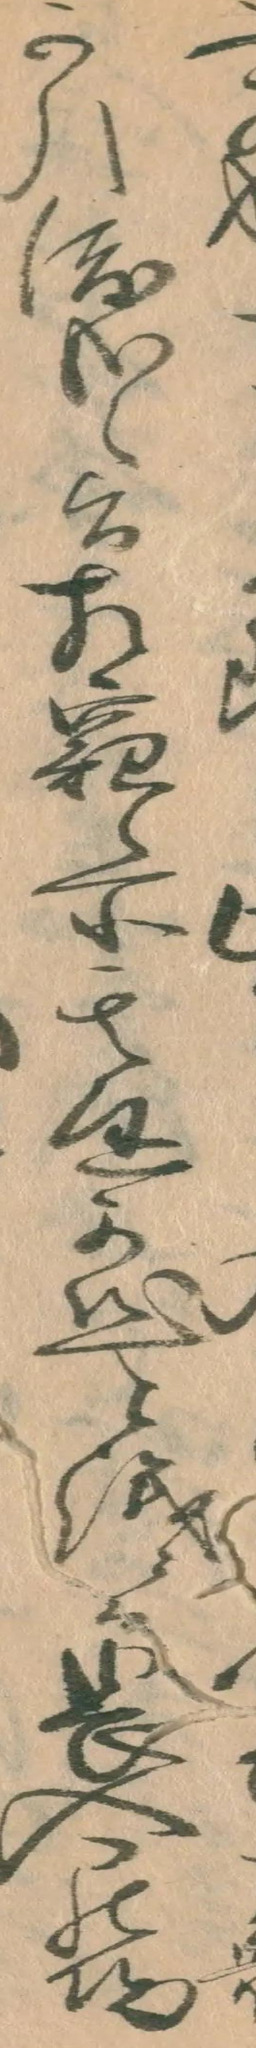可引渡哉之旨相窺候所其通可然と儀ニ而畏入罷帰
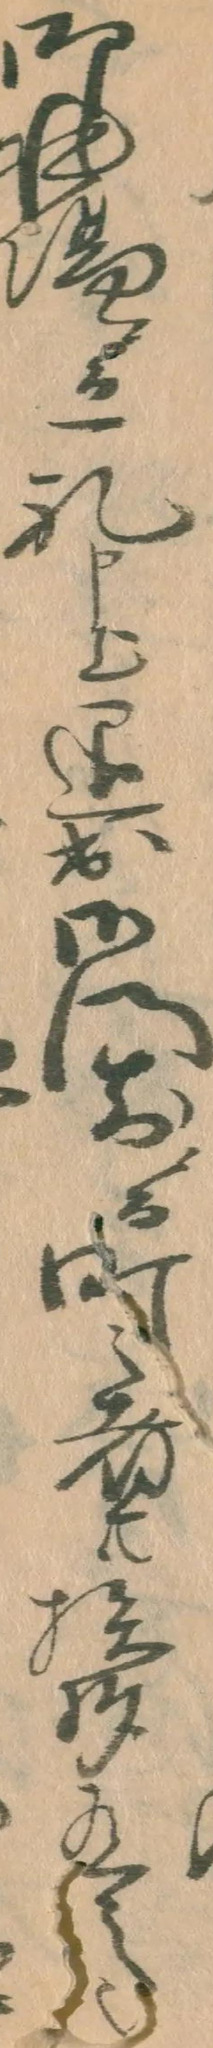御帳場ニ而一礼申上退出御門前ニ而町之者共挨拶有之也
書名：賀茂社記録. 第60冊
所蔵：国立国会図書館 National Diet Library, JAPAN
